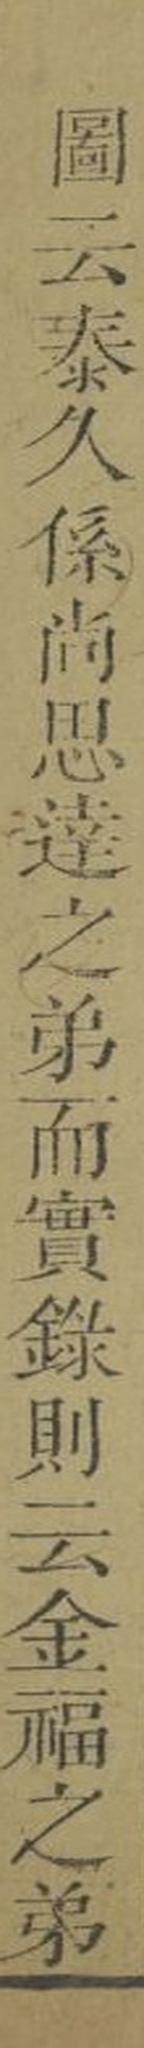図云泰久係尚思達之弟而実録則云金福之弟
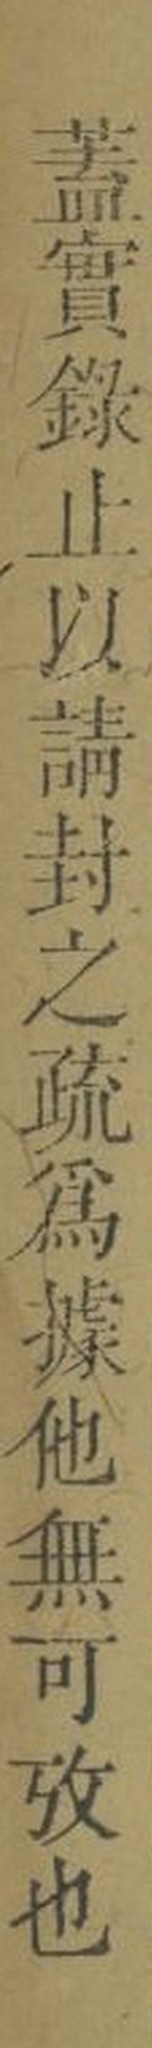蓋実録止以請封之疏為拠他無可攷也

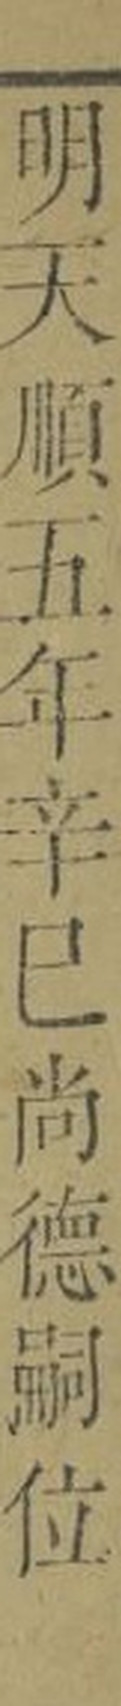明天順五年辛巳尚徳嗣位
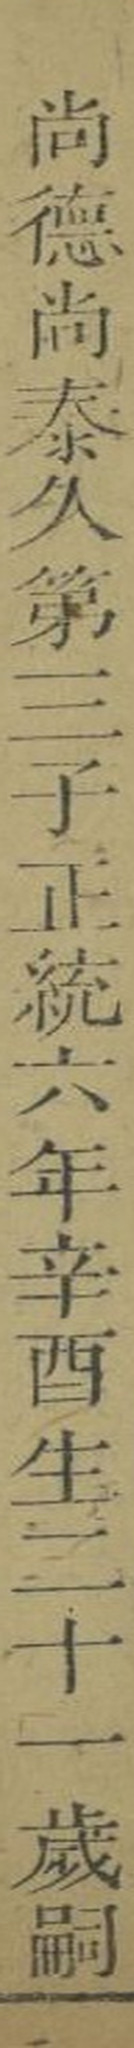尚徳尚泰久第三子正統六年辛酉生二十一歳嗣
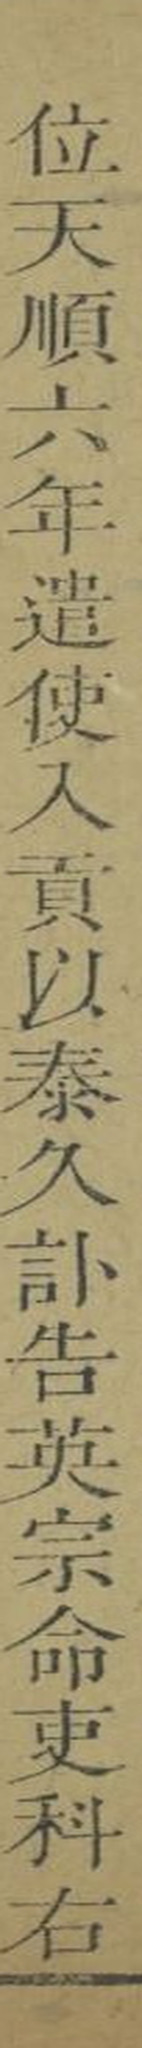位天順六年遣使入貢以泰久訃告英宗命吏科右
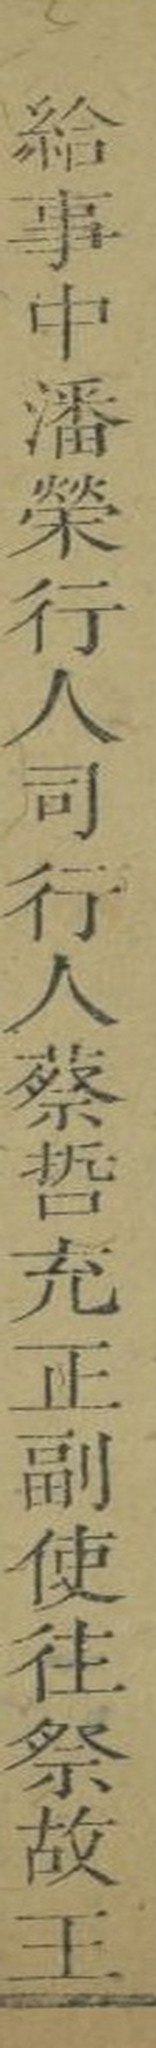給事中潘栄行人司行人蔡哲充正副使往祭故王
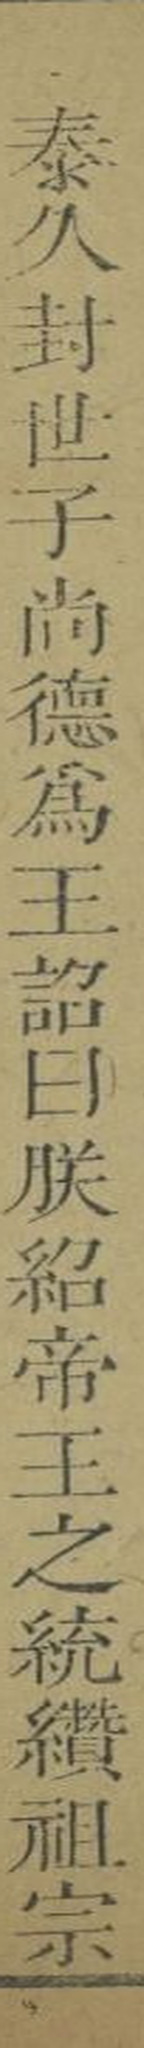泰久封世子尚徳為王詔曰朕紹帝王之統纘祖宗
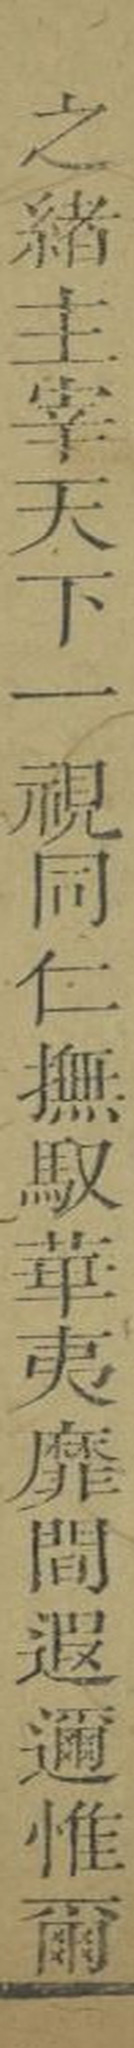之緒主宰天下一視同仁撫馭華夷靡間遐邇惟爾
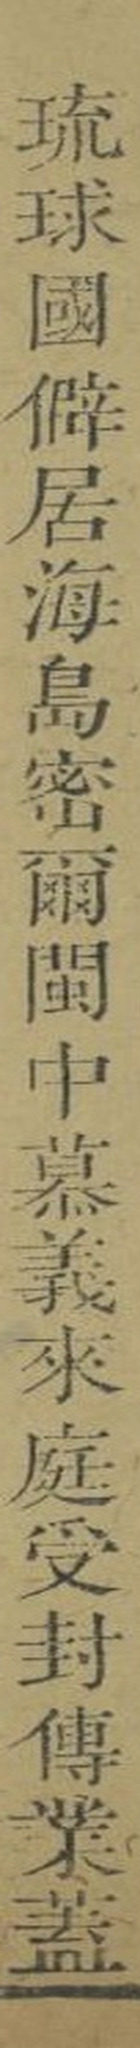琉球国僻居海島密爾閩中慕義来庭受封伝業蓋
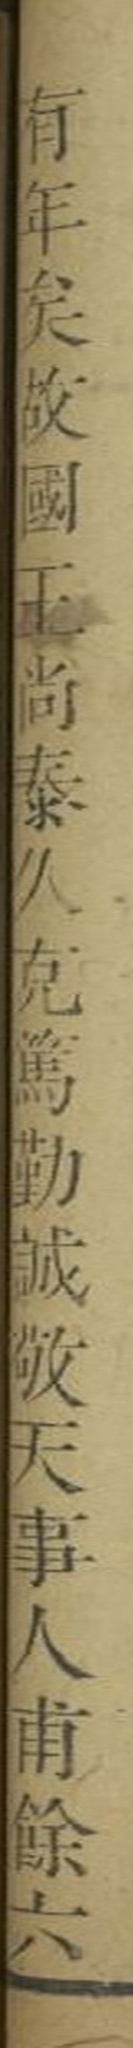有年矣故国王尚泰久克篤勤誠敬天事人甫余六
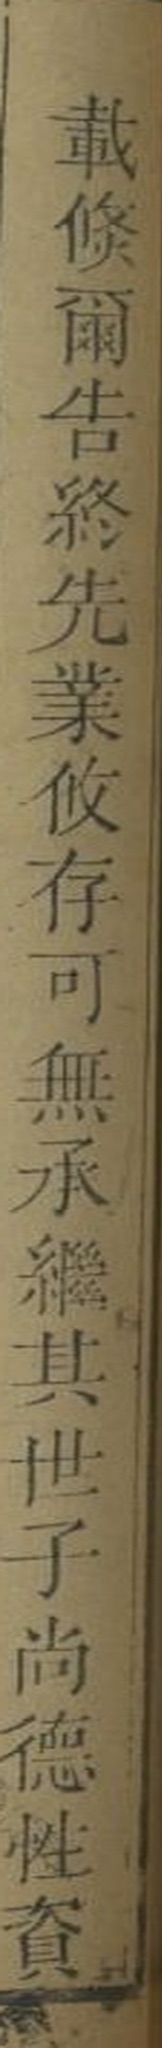載倏爾告終先業攸存可無承継其世子尚徳性資
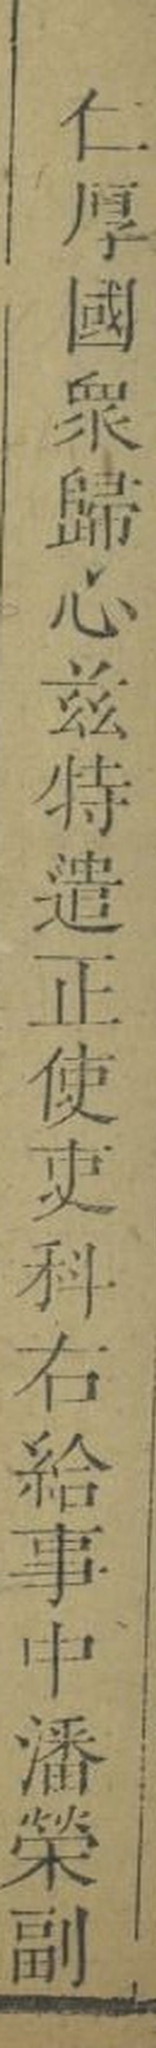仁厚国衆帰心茲特遣正使吏科右給事中潘栄副
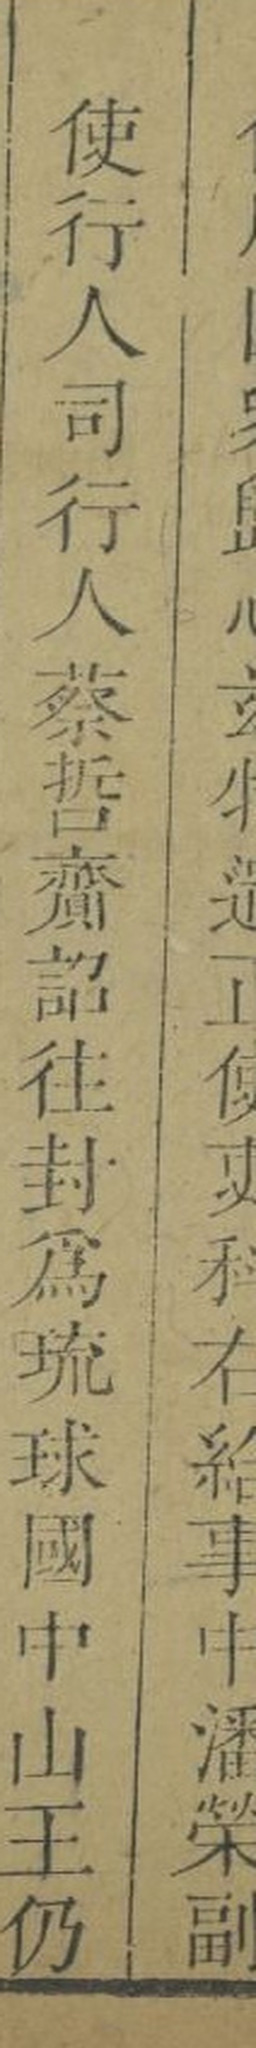使行人司行人蔡哲齎詔往封為琉球国中山王仍
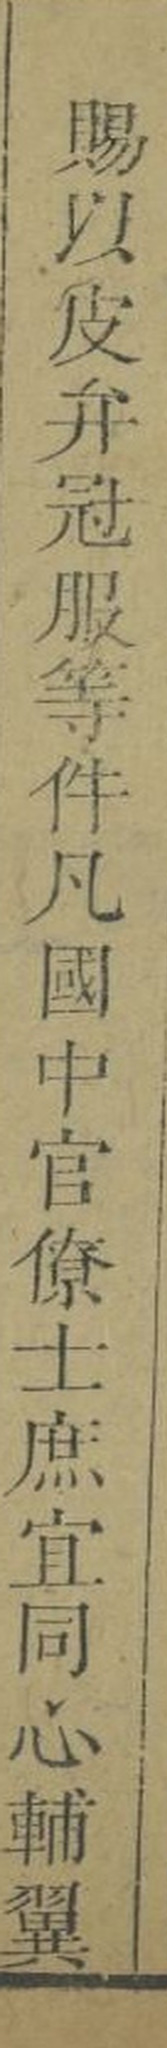賜以皮弁冠服等件凡国中官僚士庶宜同心輔翼
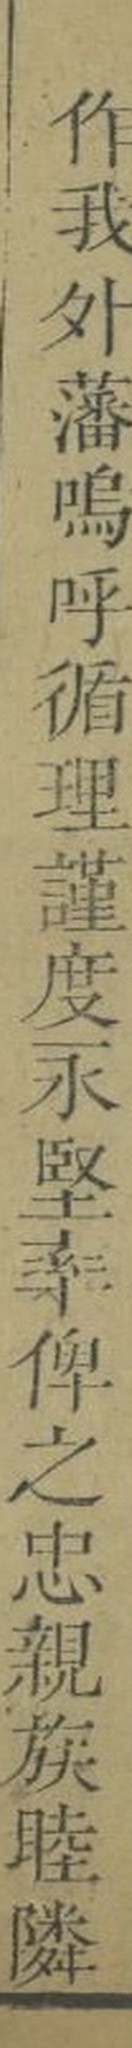作我外藩嗚呼循理謹度永堅率俾之忠親族睦隣
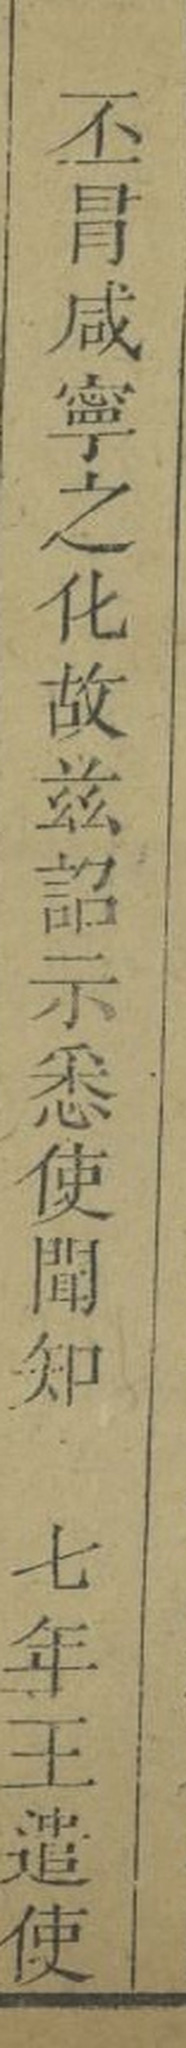丕冐咸寧之化故茲詔示悉使聞知七年王遣使
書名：中山伝信録 巻三
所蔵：University of the Ryukyus Library
